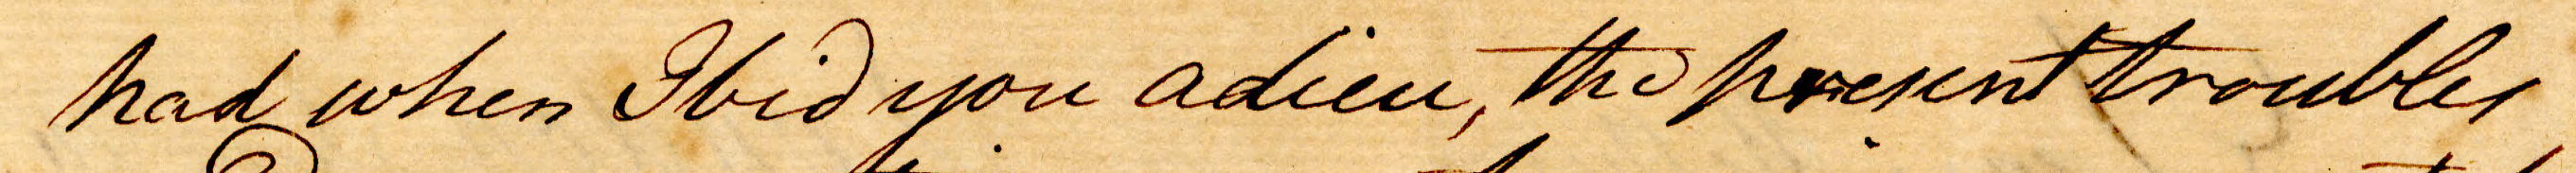had when I bid you adieu, the present troubles
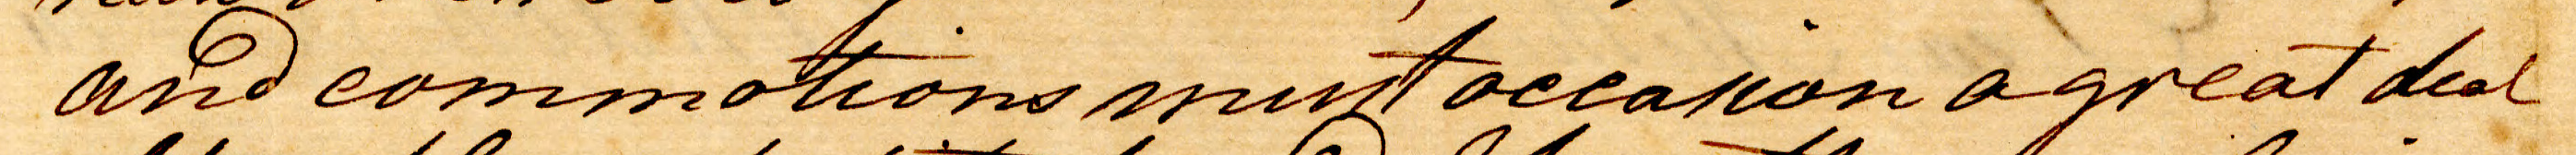and commotions must occasion a great deal
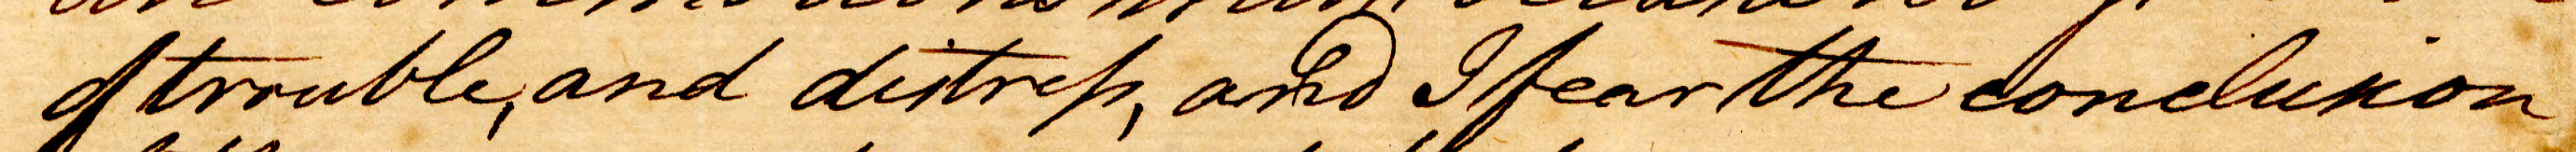of trouble, and distress, and I fear the conclusion
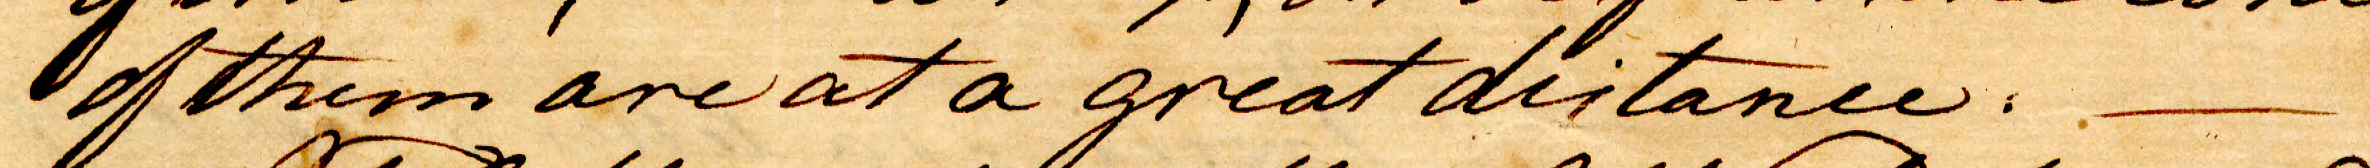of them are at a great distance.-
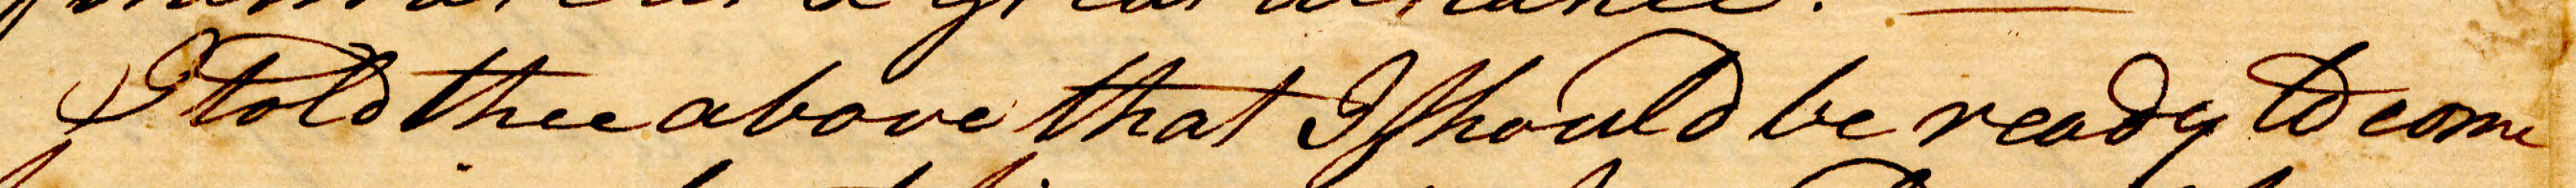I told thee above that I should be ready to come
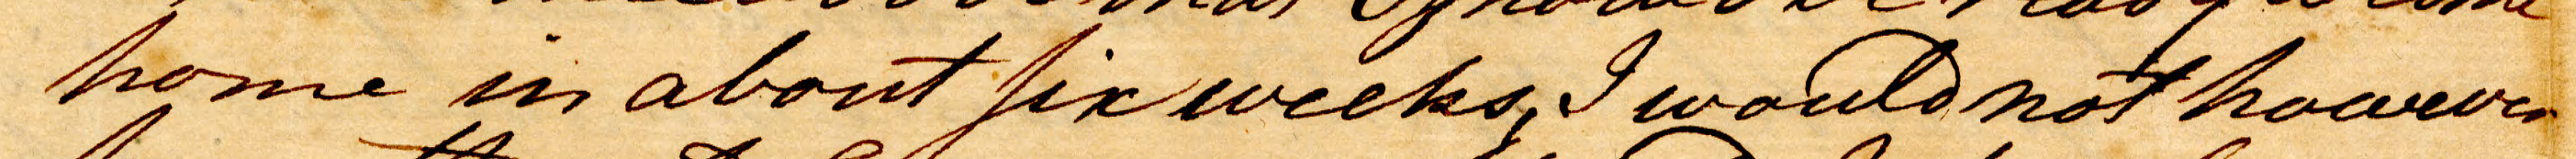home in about six weeks, I would not however
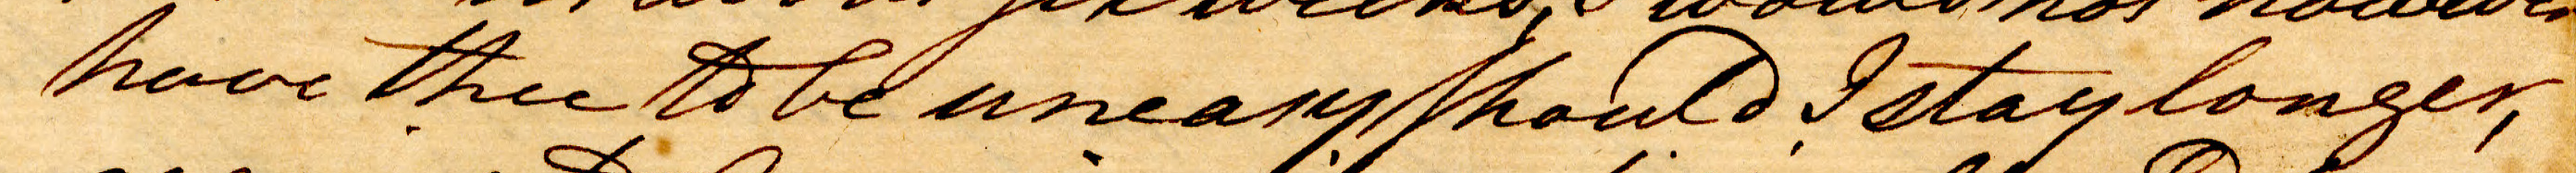have thee to be uneasy should I stay longer,
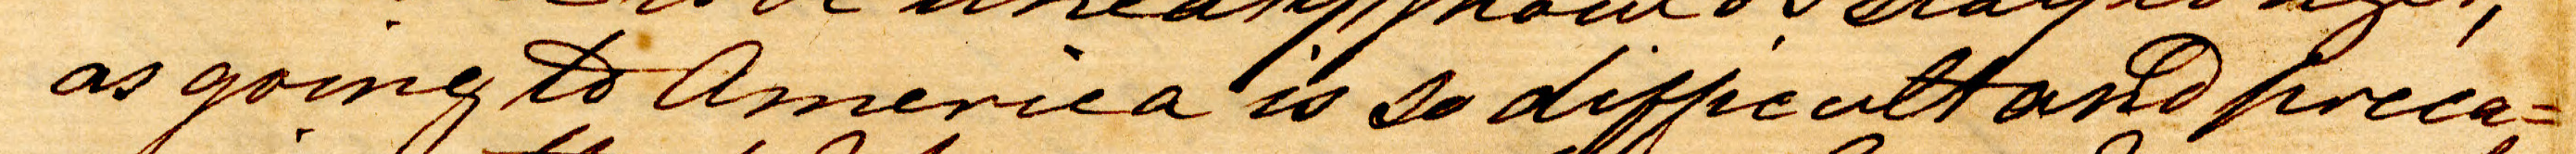as going to America is difficult and preca-
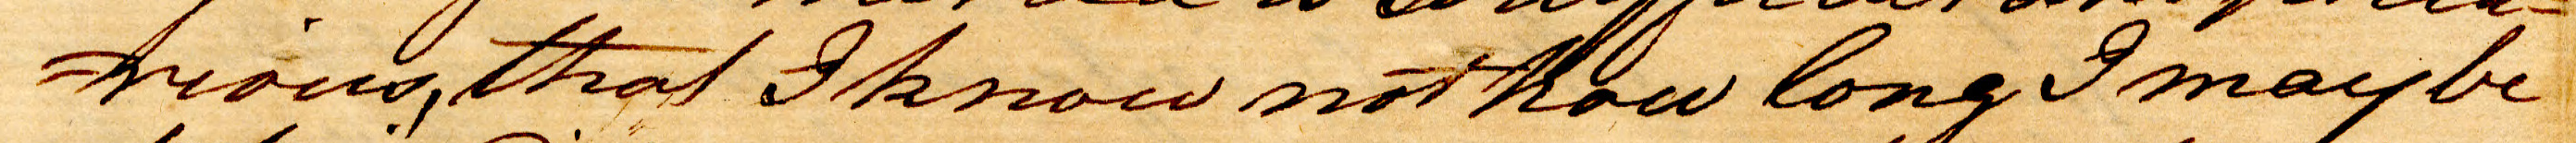-rious, that I know not how long I may be
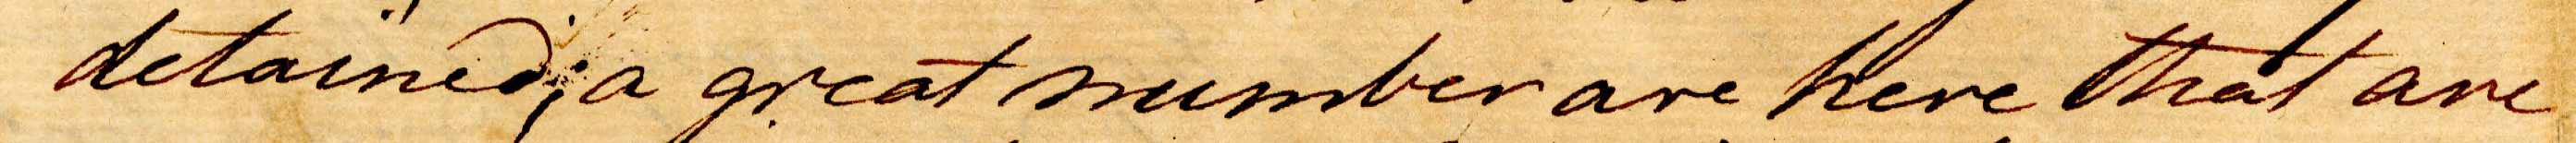detained; a great number are here that are
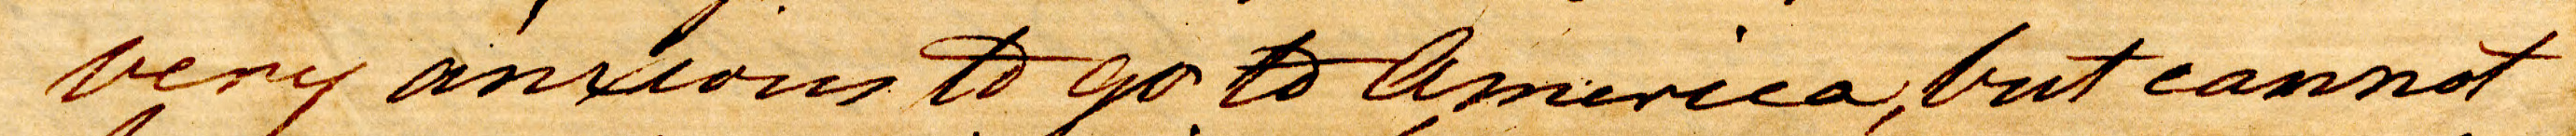very anxious to go to America, but cannot
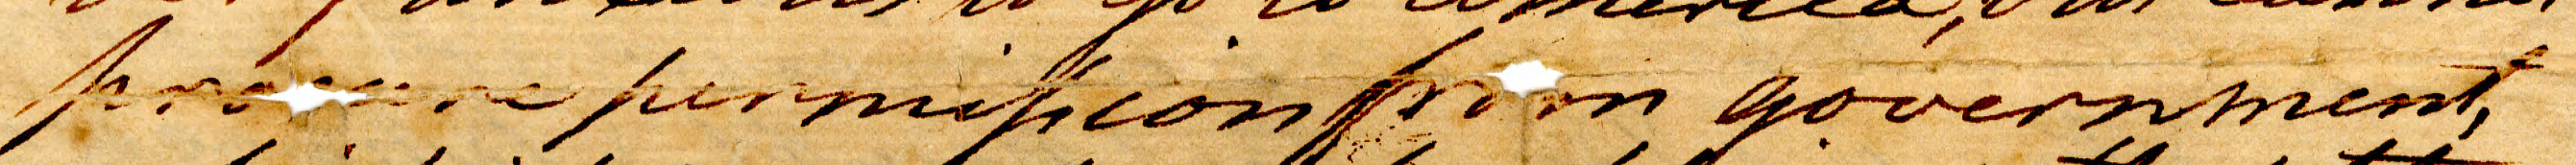procure permission from government,
